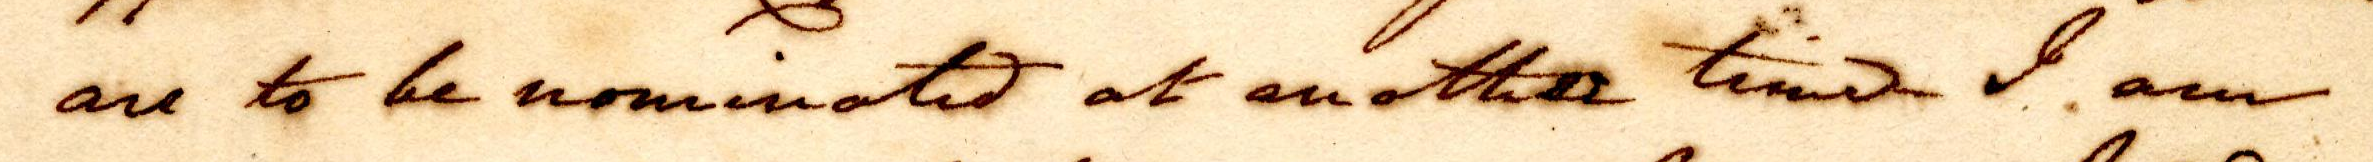are to be nominated at another time. I am
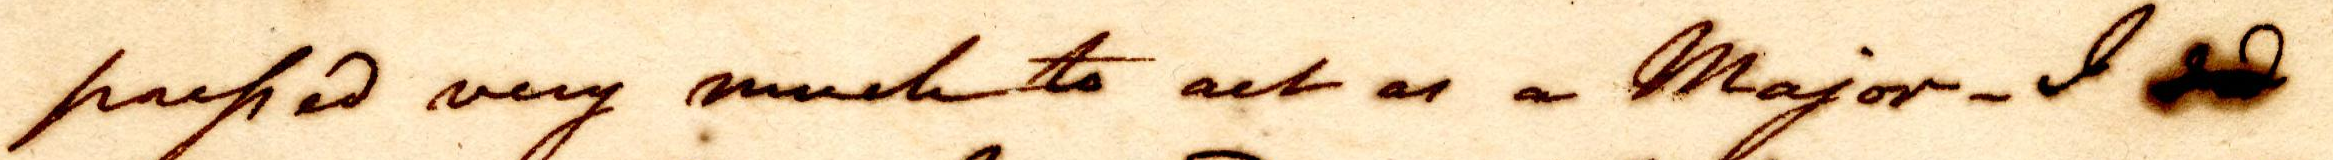paessed very much to act as a Major. I [__]
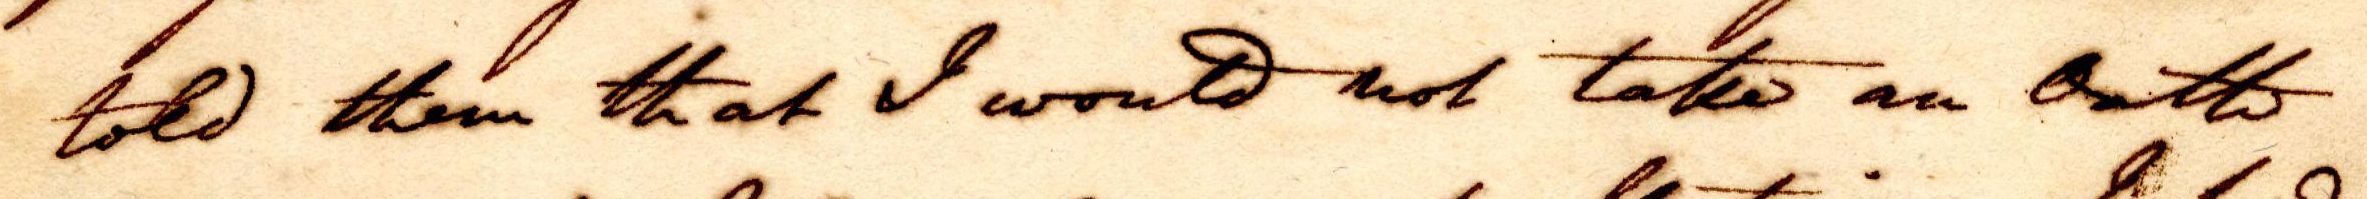told them that I would not take an Oath
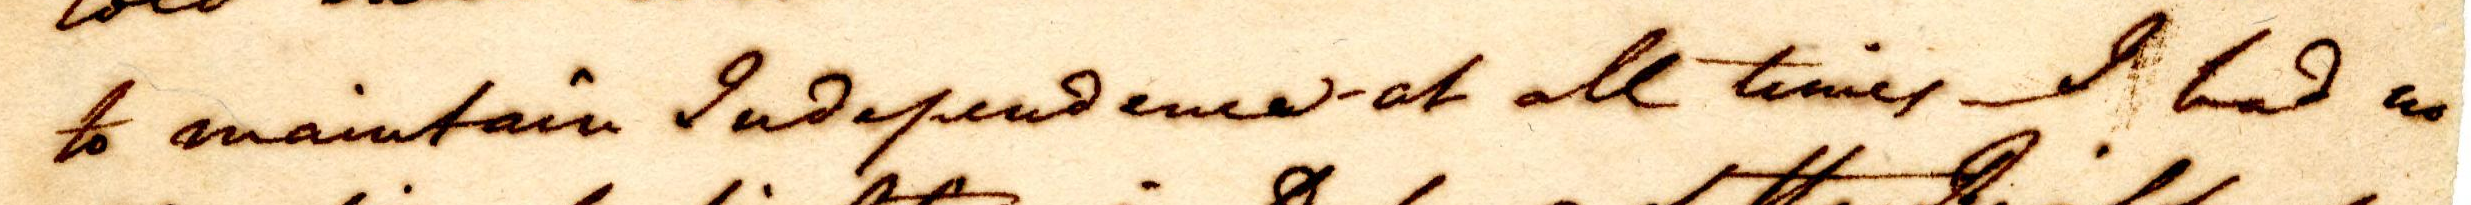to maintain Independence at all times. I bad us
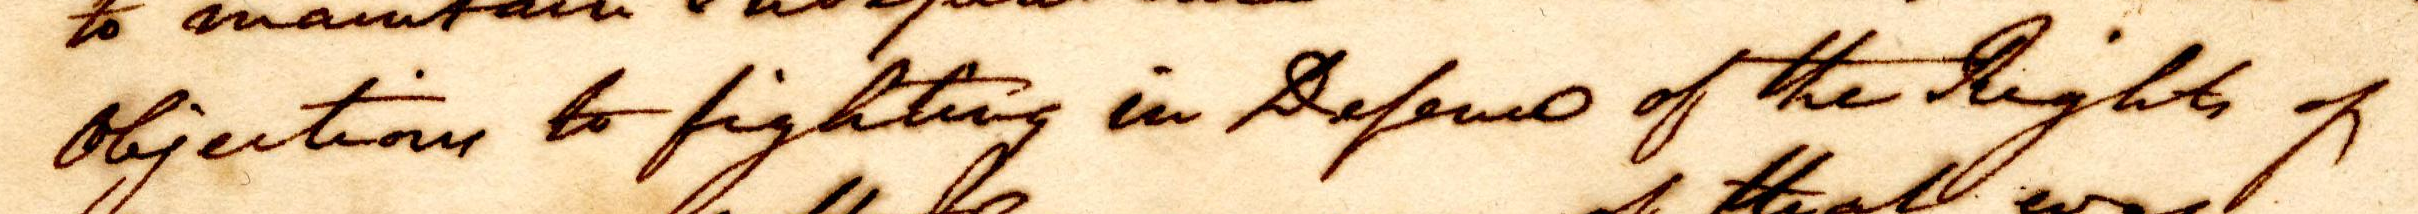Objections to fighting in Defence of the Rights of
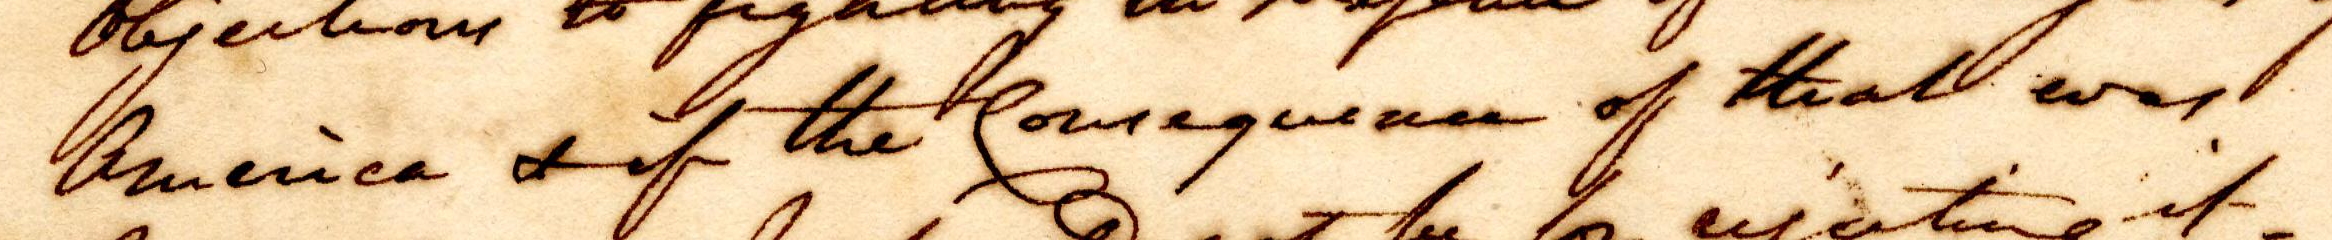America & if the Consequence of that was
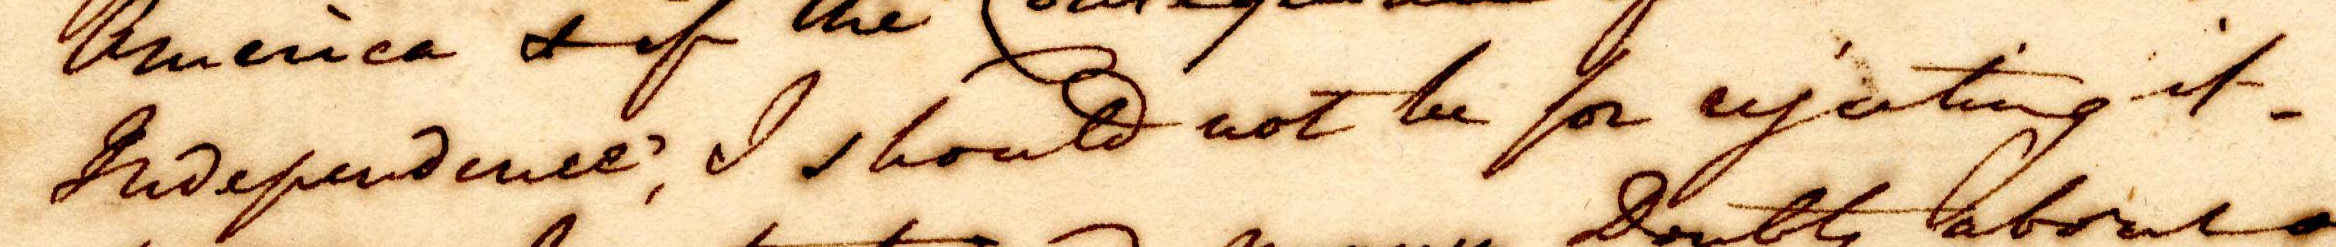Independence; I should not be for rejecting it,
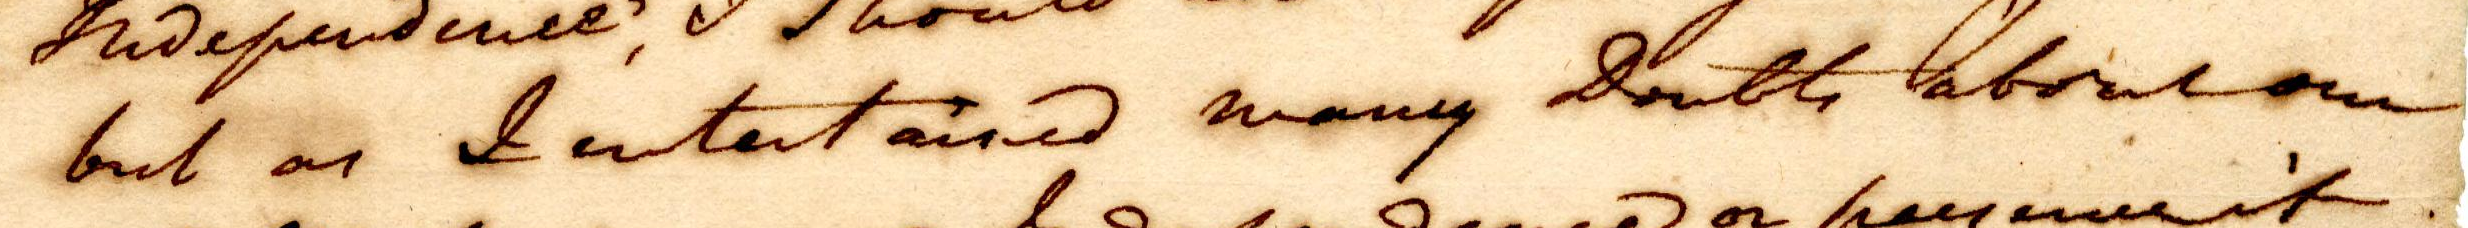but as I entertained many Doubts about our
